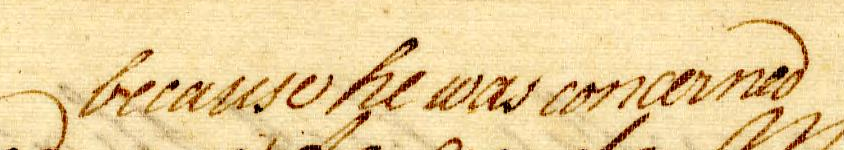because he was concerned
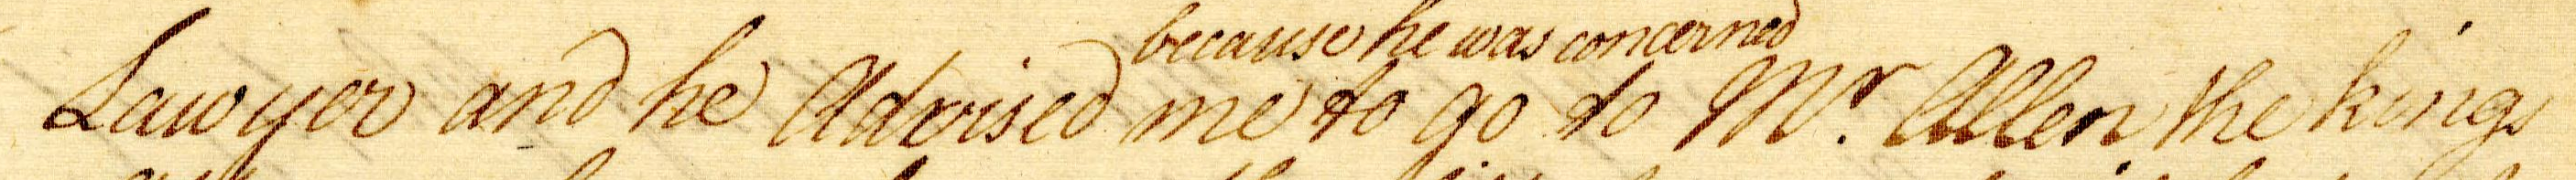Lawyer and he Advised me to go to M^r. Allen the kings
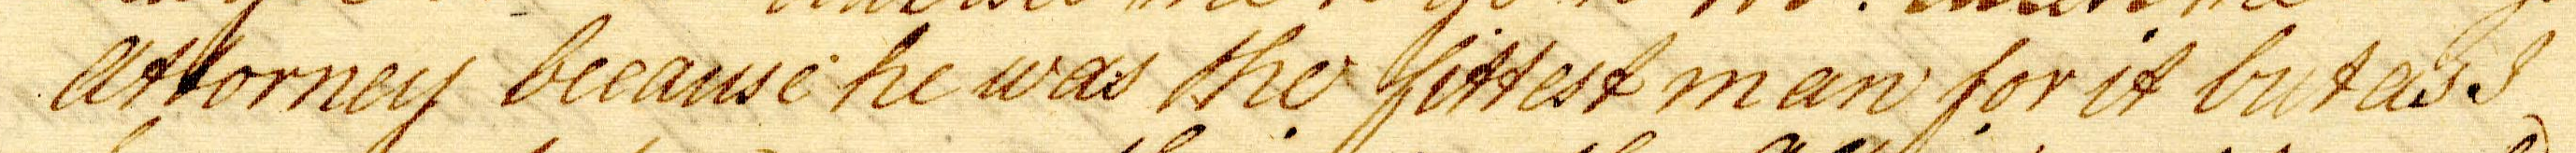Attorney because he was the fittest man for it but as I
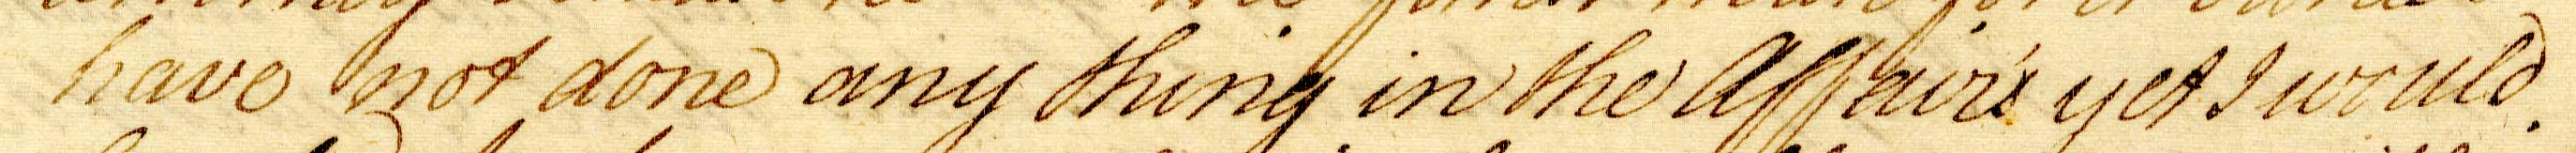have not done any thing in the Affair's yet I would
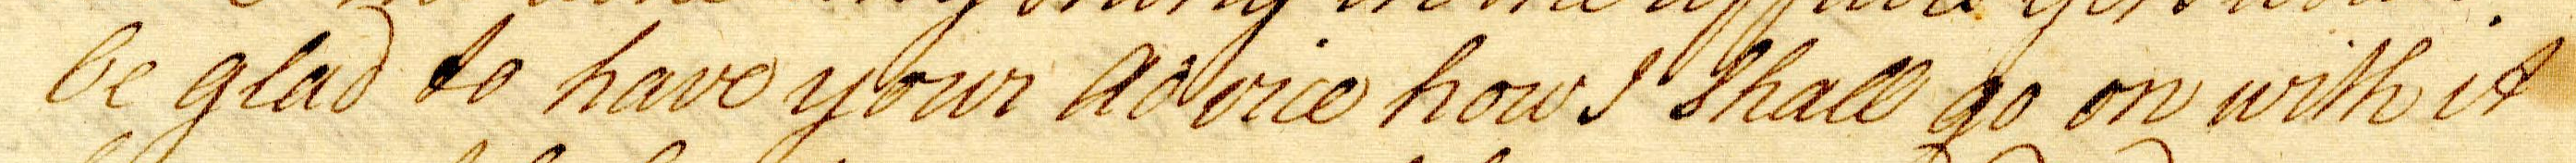be glad to have your advice how I shall go on with it
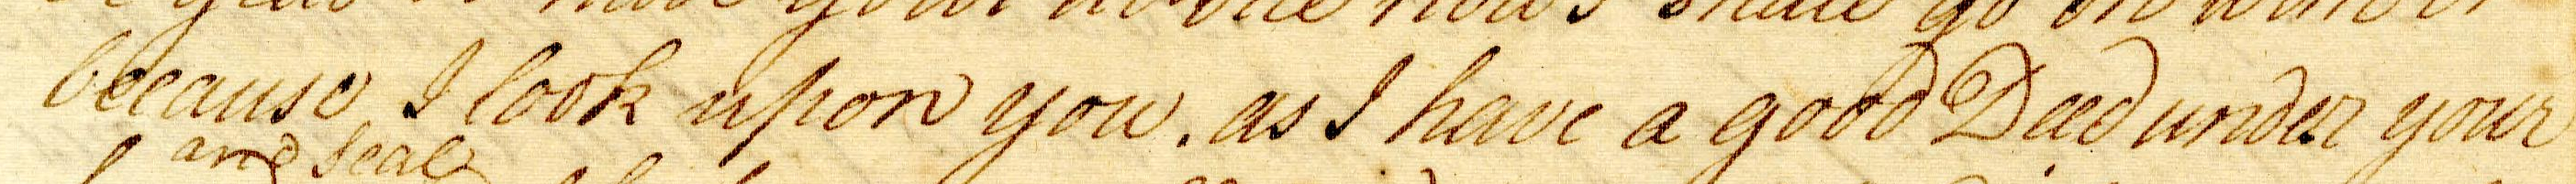because I look upon you, as I have a good Deed under your
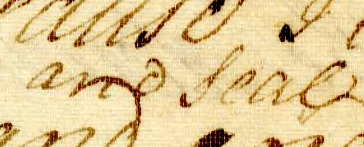and Seal
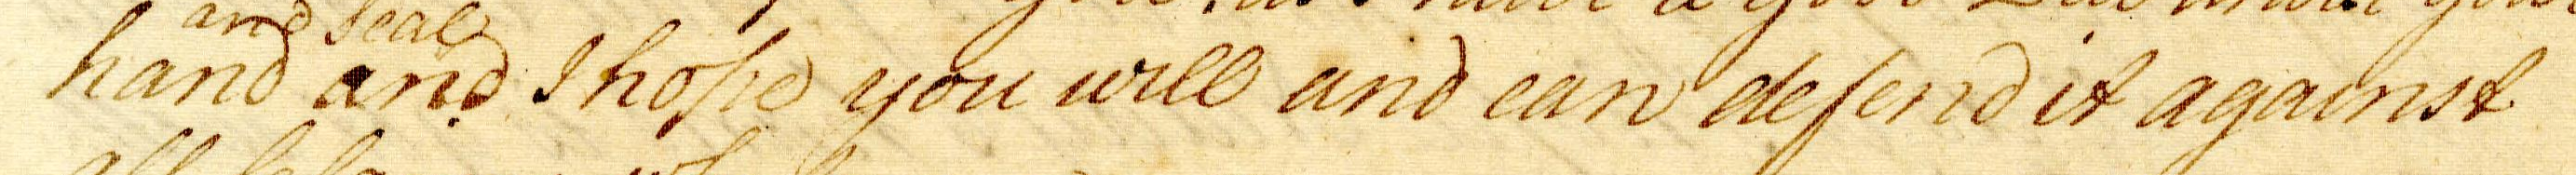hand and I hope you will and can defend it against
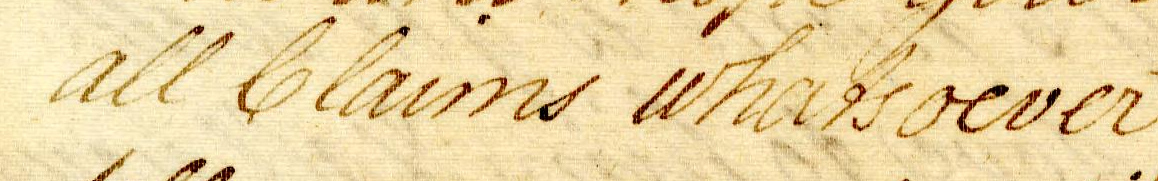All Claims whatsoever
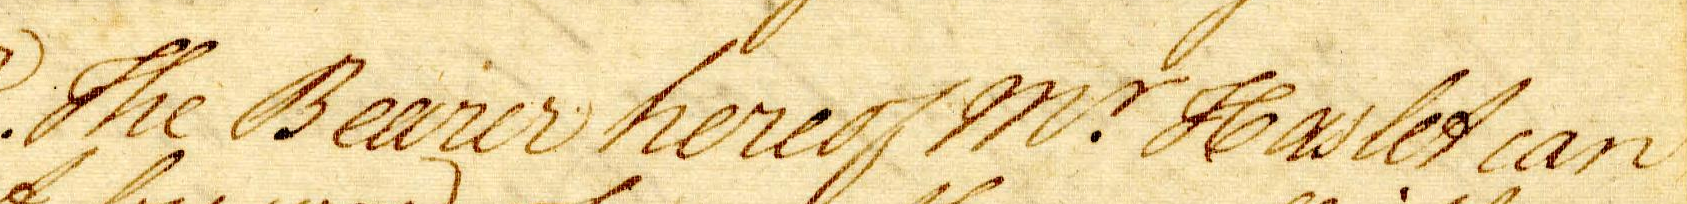The Bearer here of M^r. Haslet can
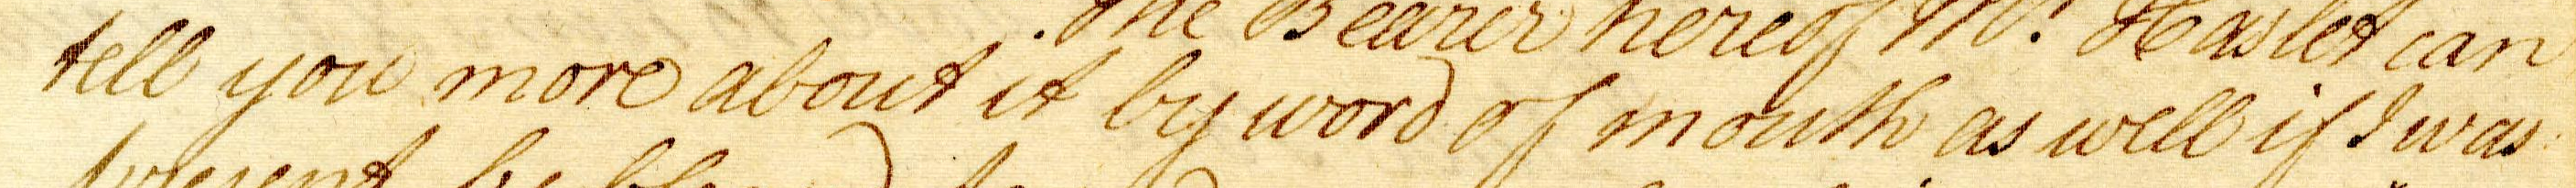tell you more about it by word of mouth as well if I was
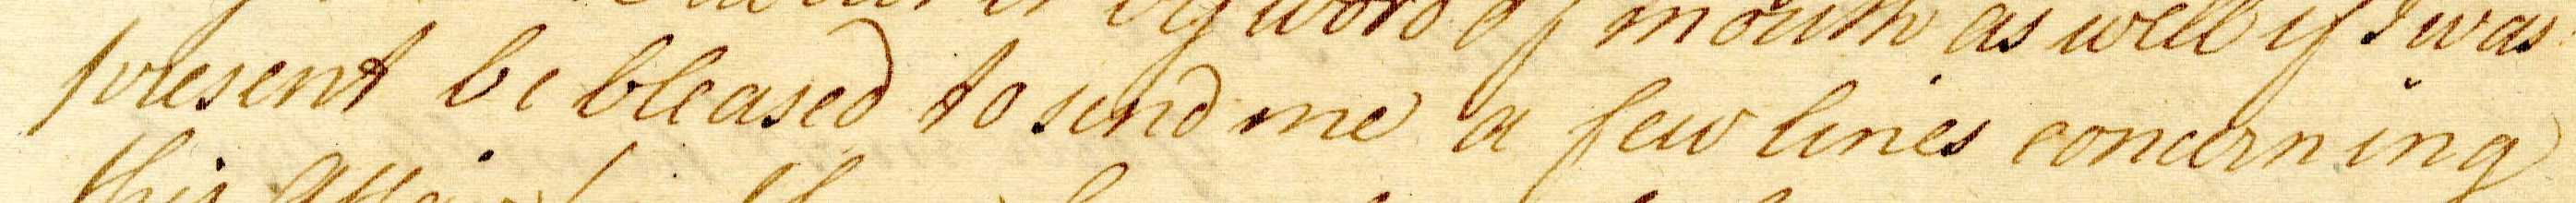present be bleased to send me a few lines concerning
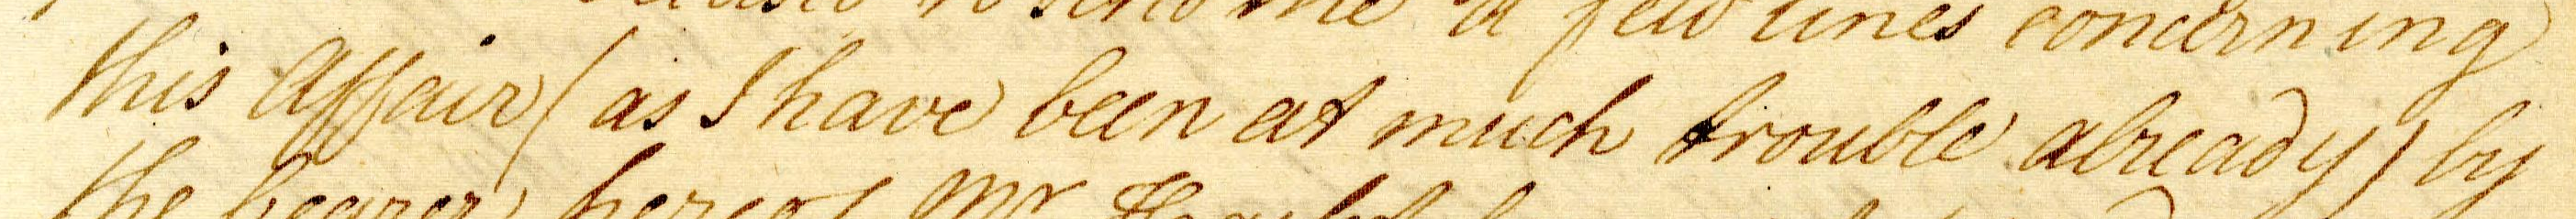this Affair (as I have been at much trouble already) by
